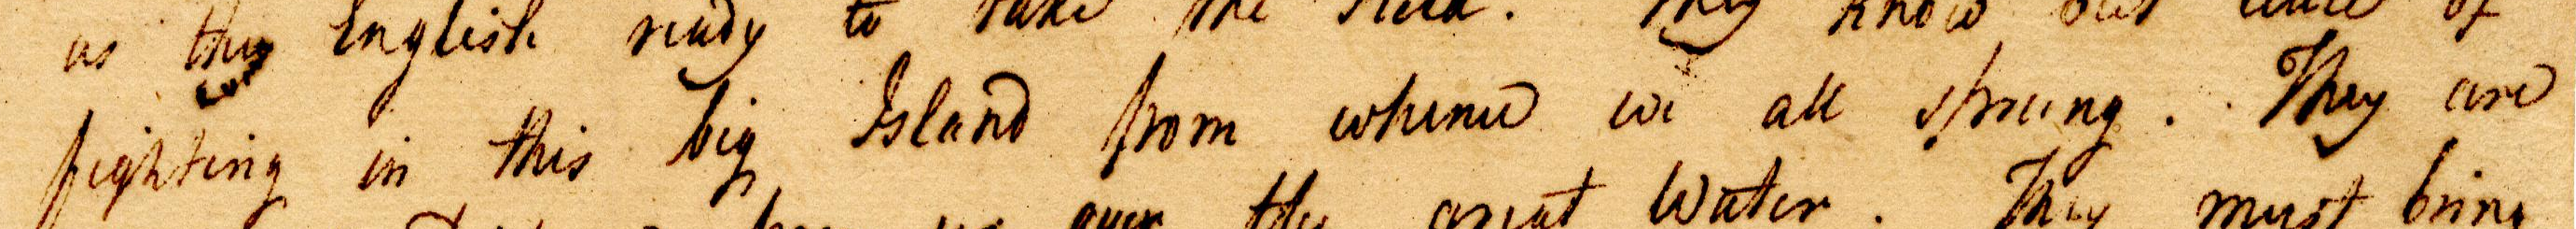fighting in this big Island from whence we all spring. They are
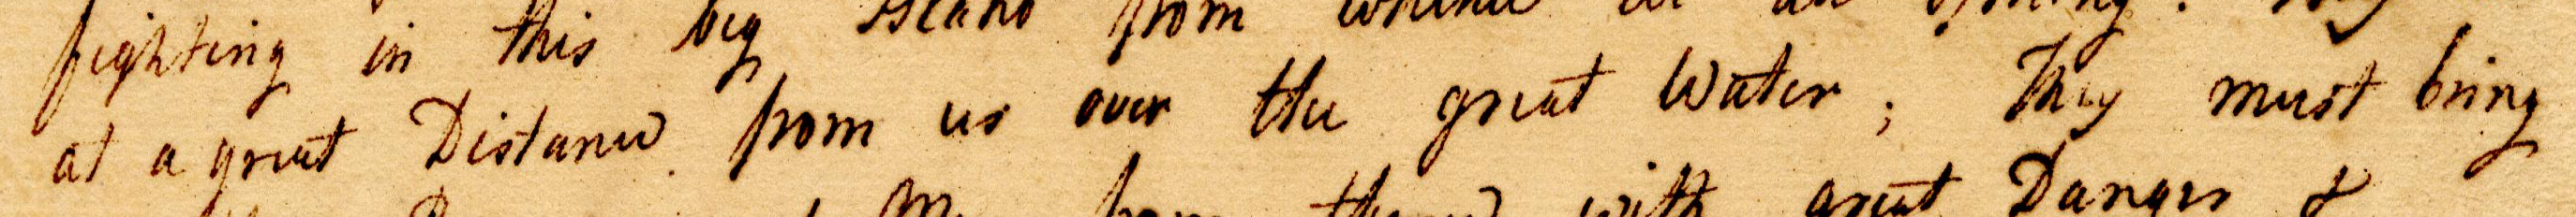at a great Distance from us over the great Water; They must bring
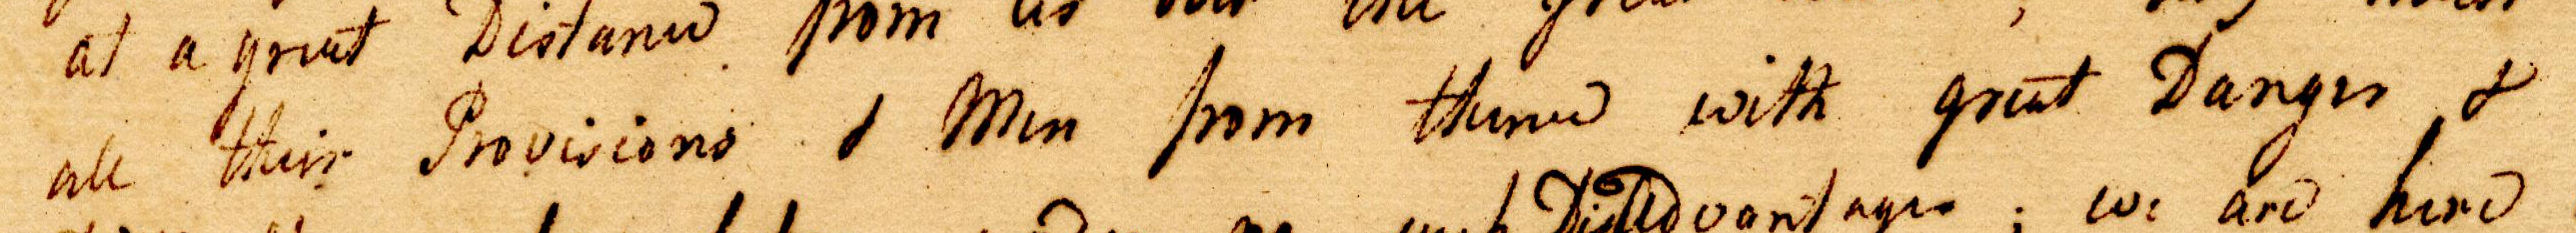all their Provisions & Men from there with great Danger &
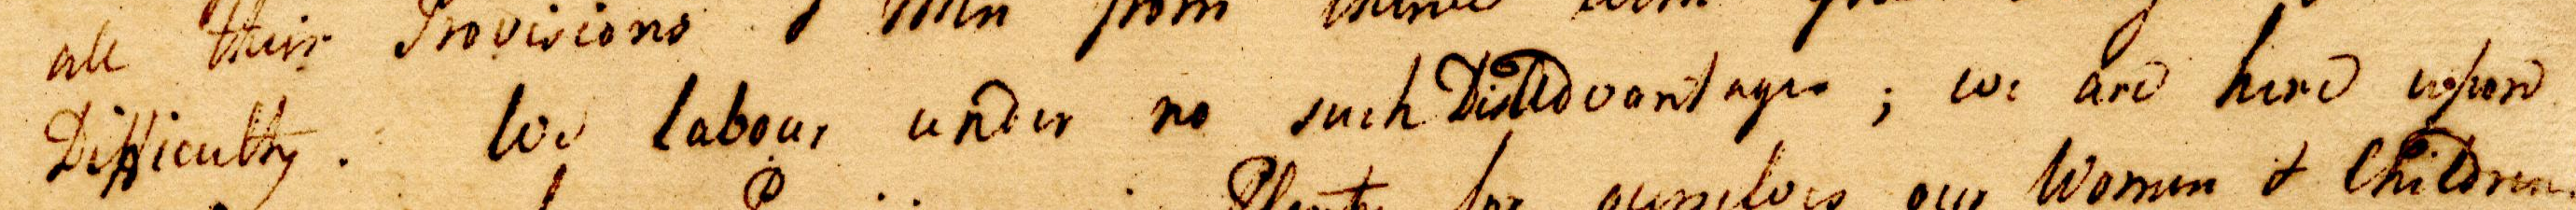Difficulty. We labour under no such Disadvantages; we are here upon
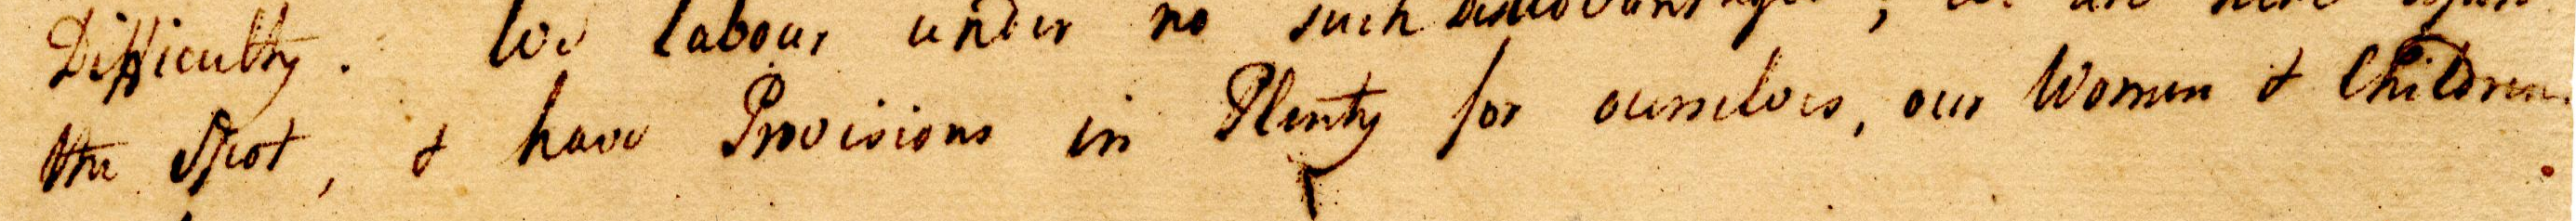the spot, & have Provisions in Plenty for ourselves, our Women & Children.
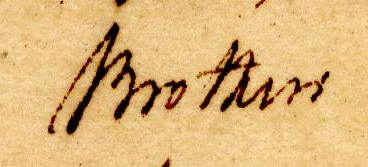Brothers
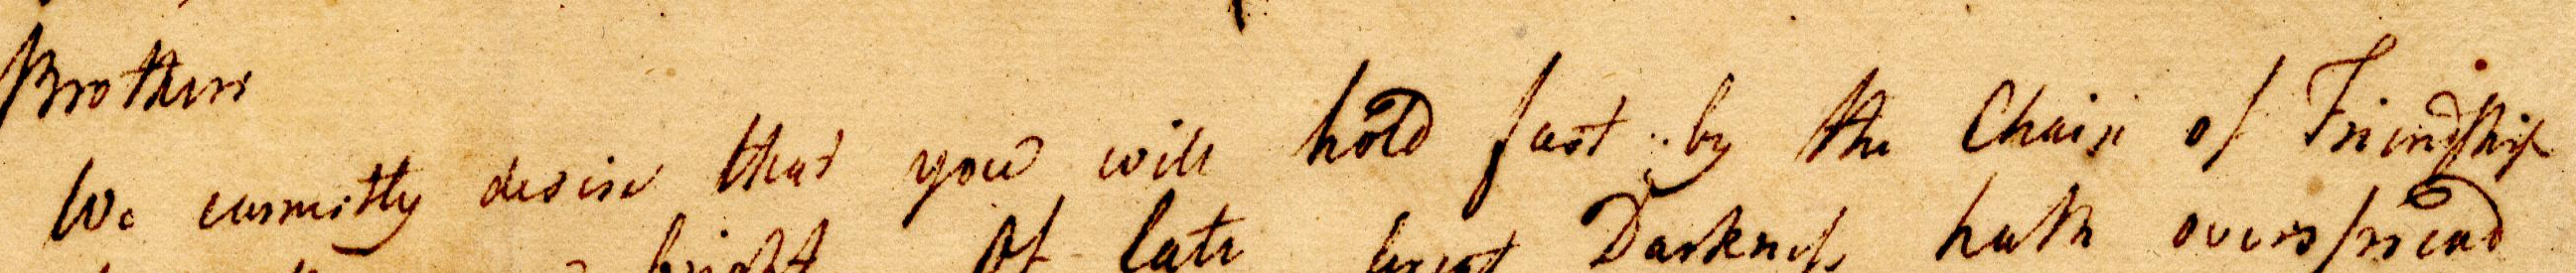We currently desire that you will hold fast by the Chain of Friendship
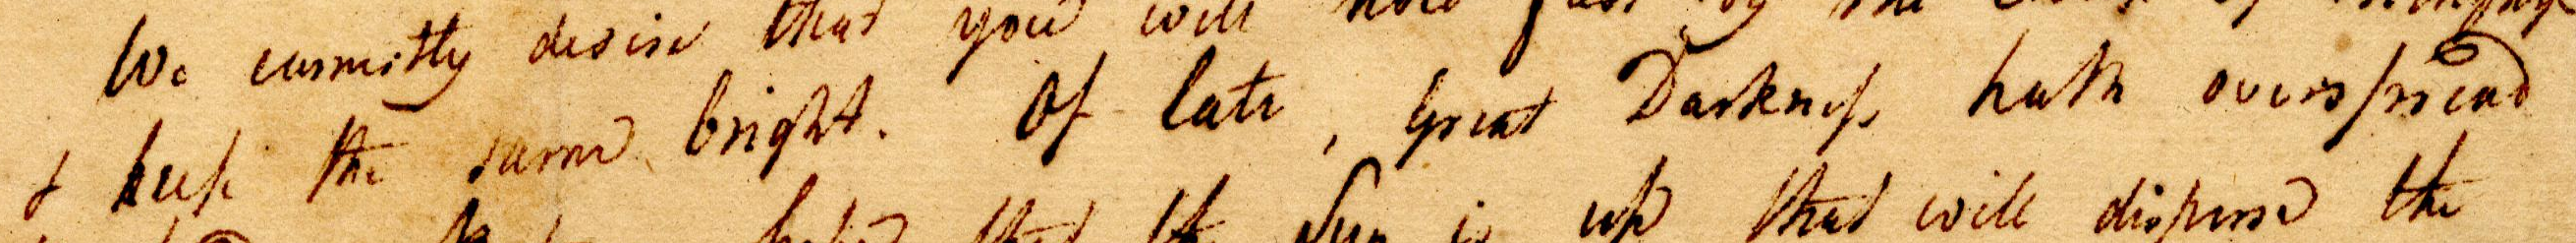& keep the same bright. Of late, Great Darkness hath overspread
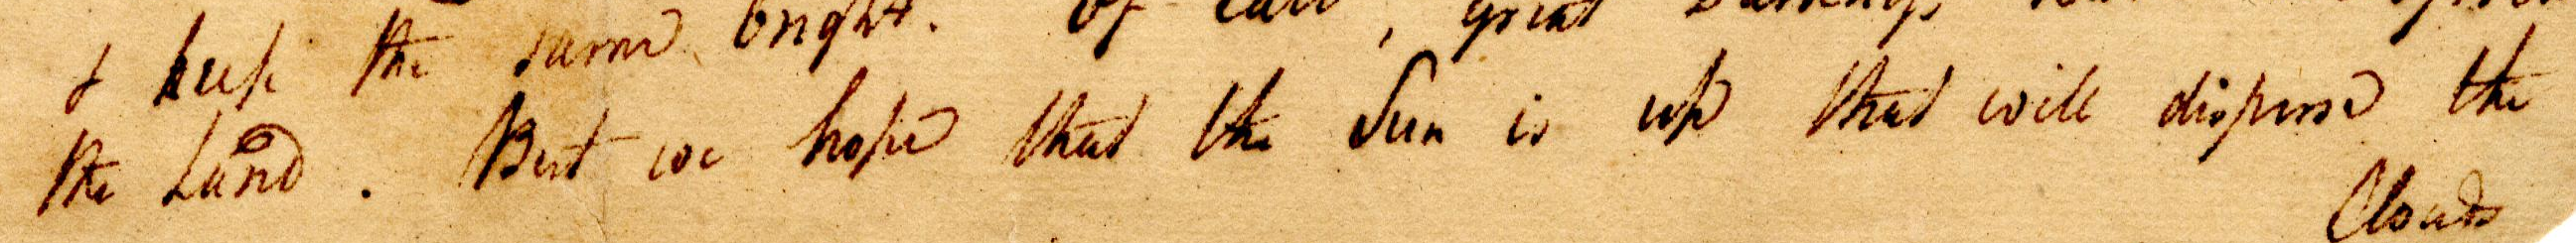the Land. But we hope that the Sun is up that will dispense the
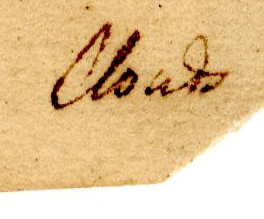Clouds
